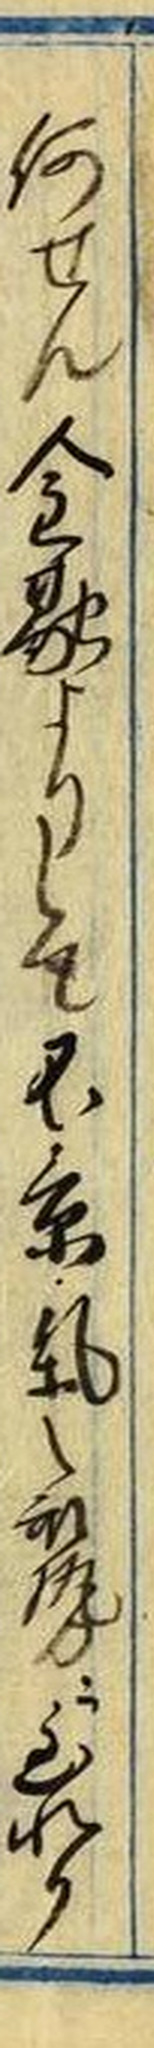何せん金融よりして不景気之形勢に至れり

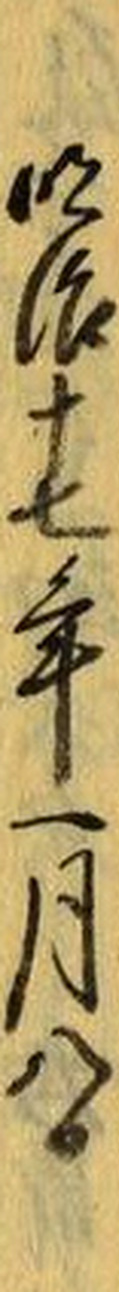明治十七年一月八日
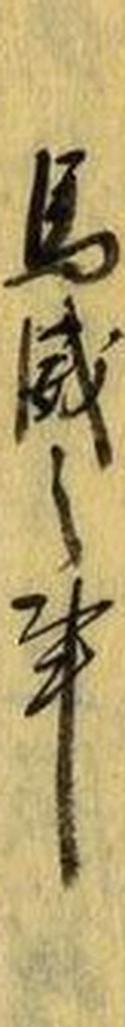馬威之事
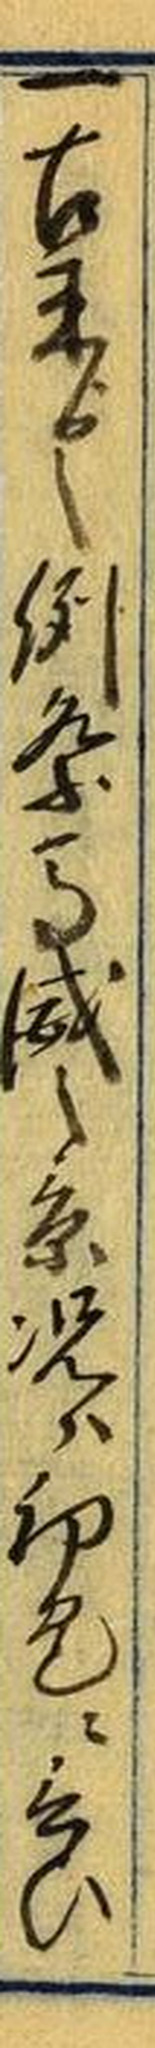一古来ゟ例祭馬威之景況ハ初巻ニ言ひ
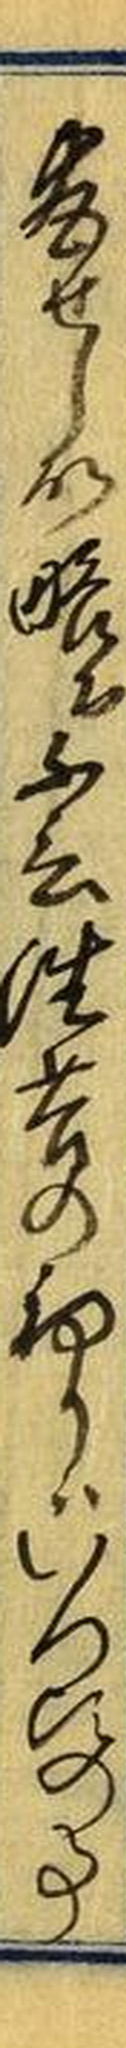尽せし故略而不言往昔の初りハいつ頃の事
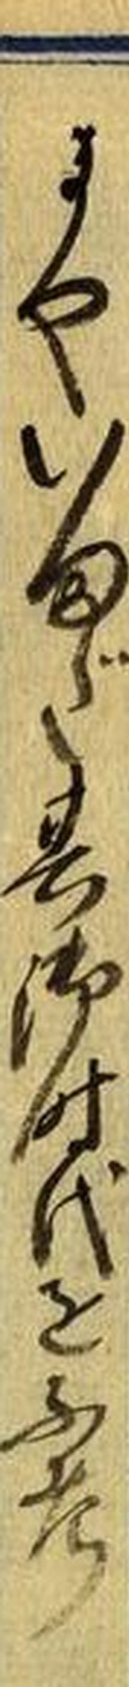にやいまだ其御時代を不考
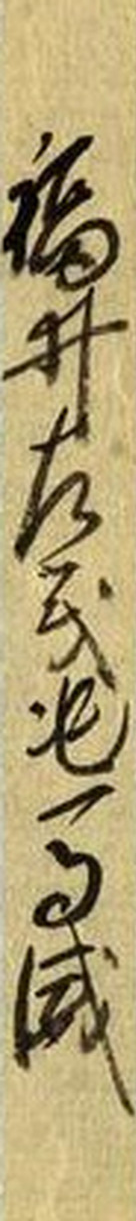福井左義兆馬威
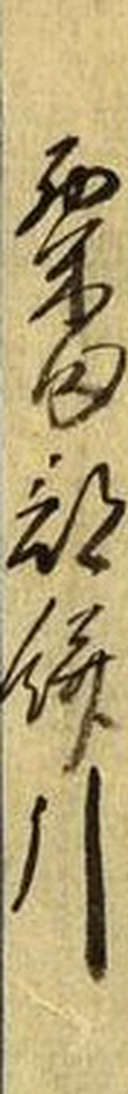粟田部餅引
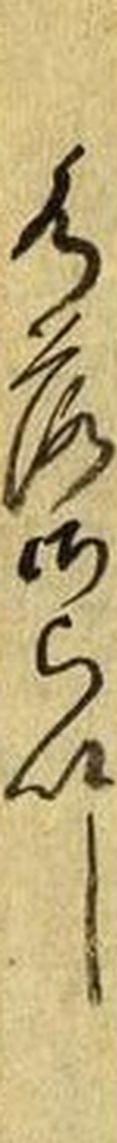水落御らいし
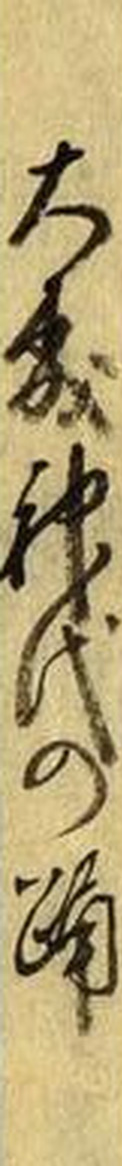大森神代の踊
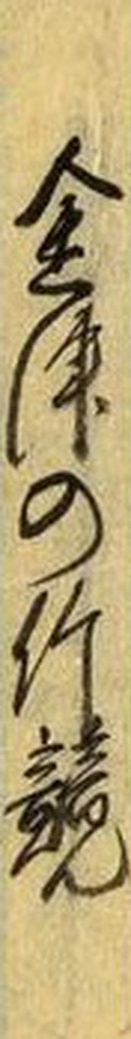金津の竹競

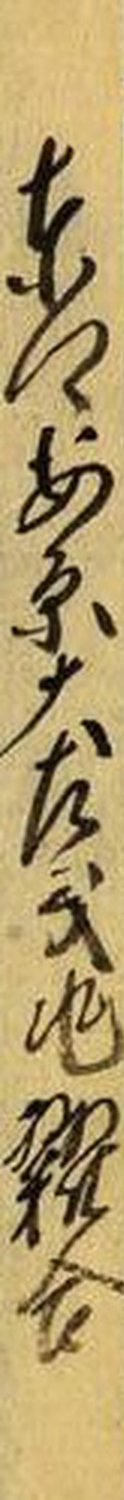東郷安原大左義兆糶合
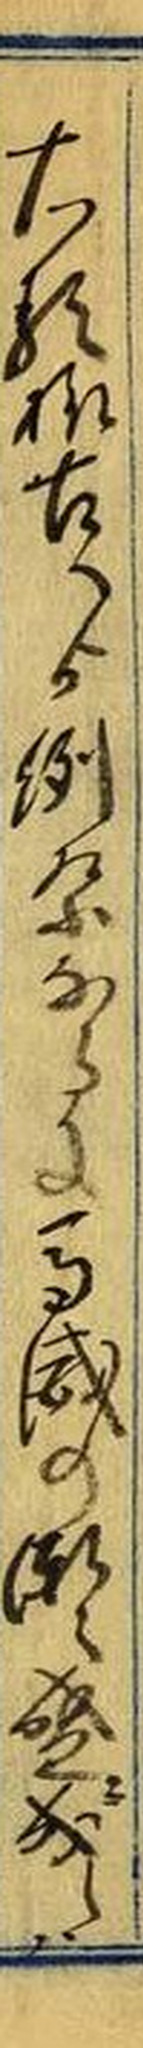右類様古へゟ例祭なるに馬威の漸々盛ニ成しハ
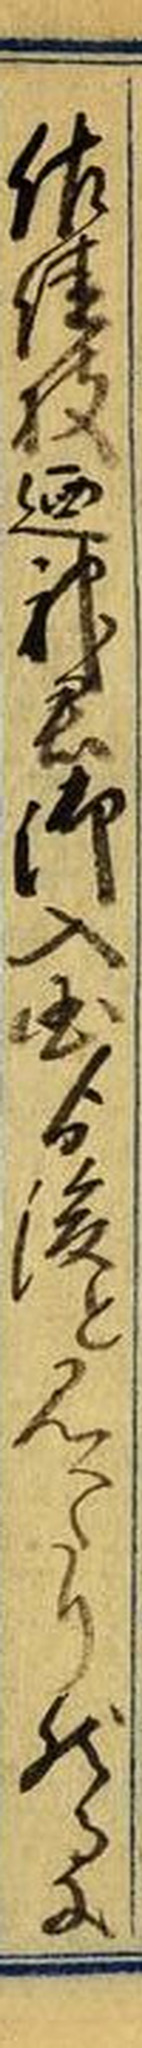佐佳枝廼神君御入国ゟ後と見へたり然るに
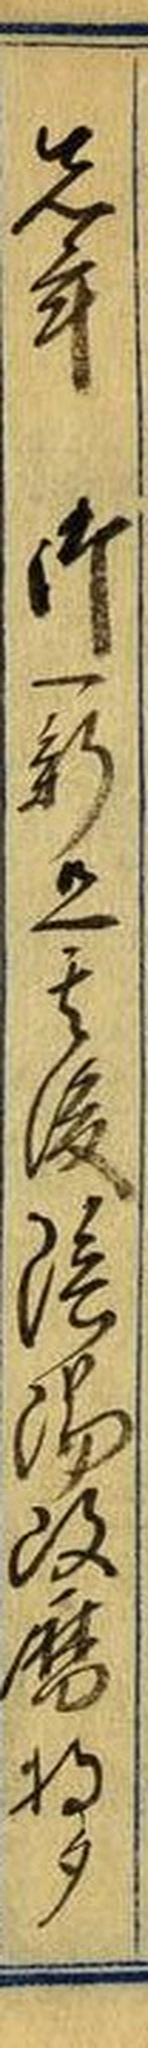先年御一新且つ其後陰陽改暦将タ
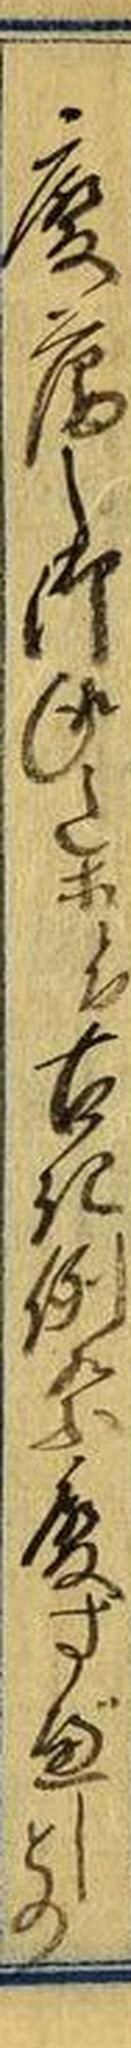廃藩之御趣意等ニ而古記例祭廃すべしとの
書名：温古集 五巻
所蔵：福井県文書館 Fukui Prefectural Archives
